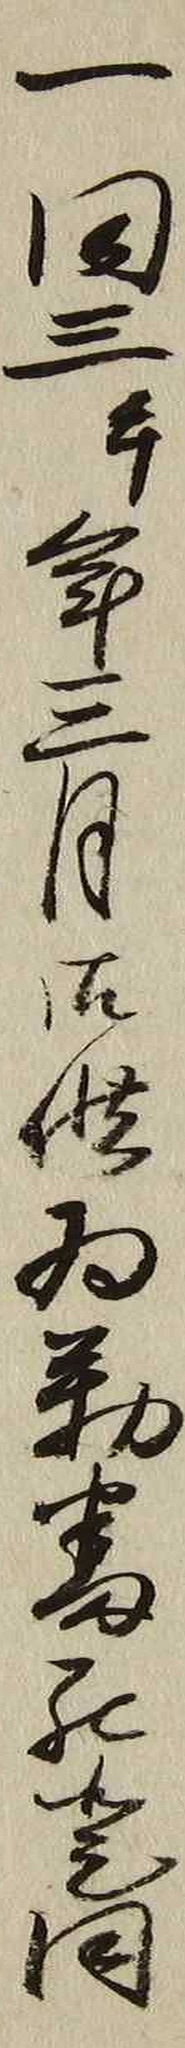一同三午年三月御供為勤番罷登同
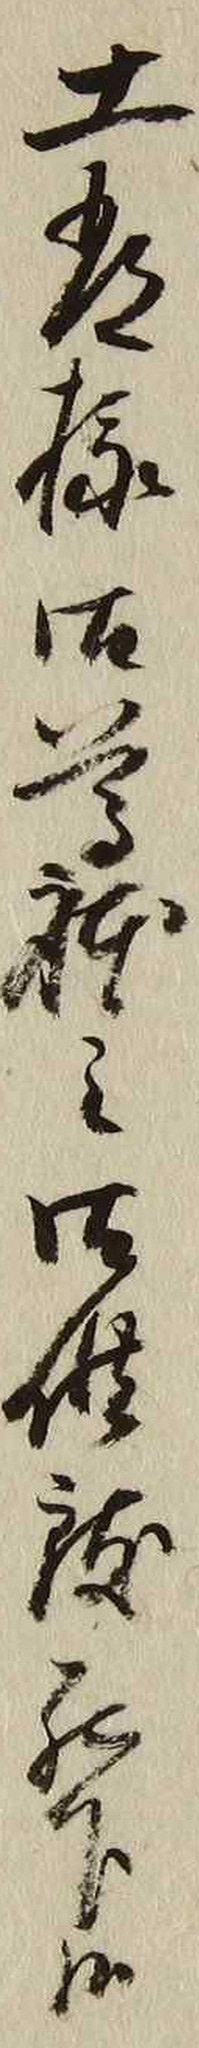土常様御尊体御供致罷下候
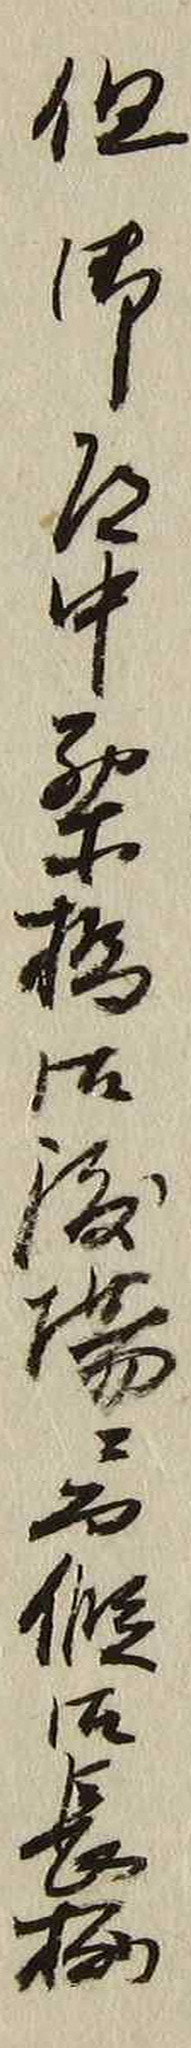但御道中栗橋御渡場ニ而仮御長柄
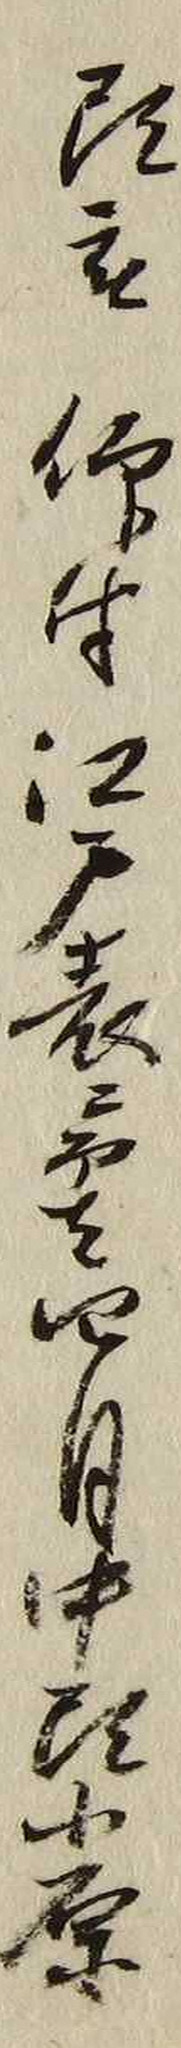頭被仰付江戸表ニ而者四月中頭小原
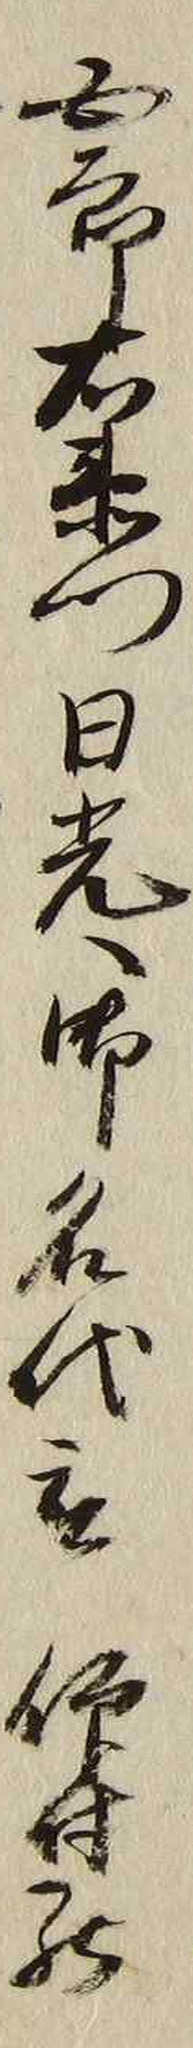五郎右衛門日光御へ御名代被仰付罷
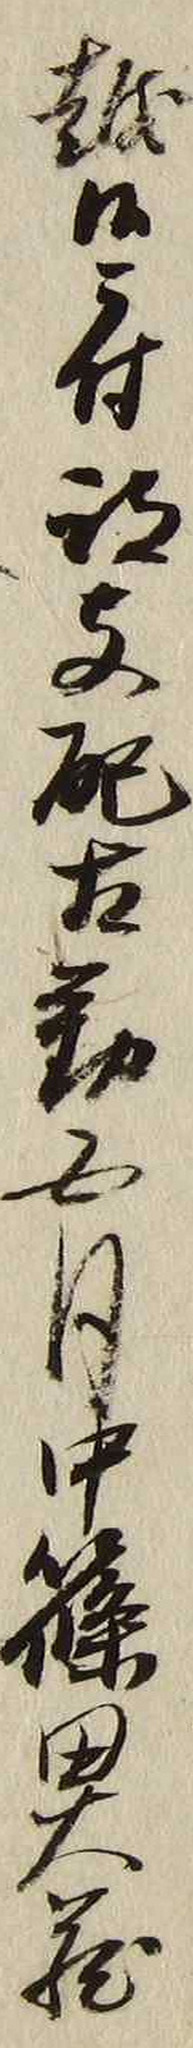越候ニ付跡支配相勤五月中篠田大蔵
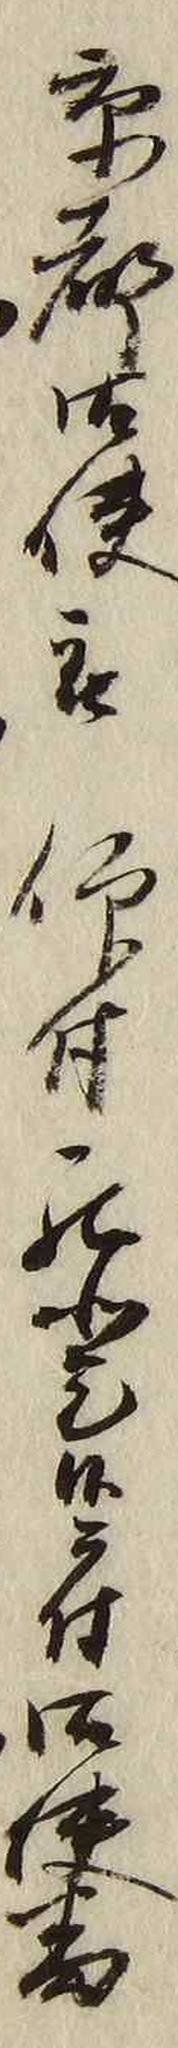京郡御使被仰付罷登候ニ付御使番
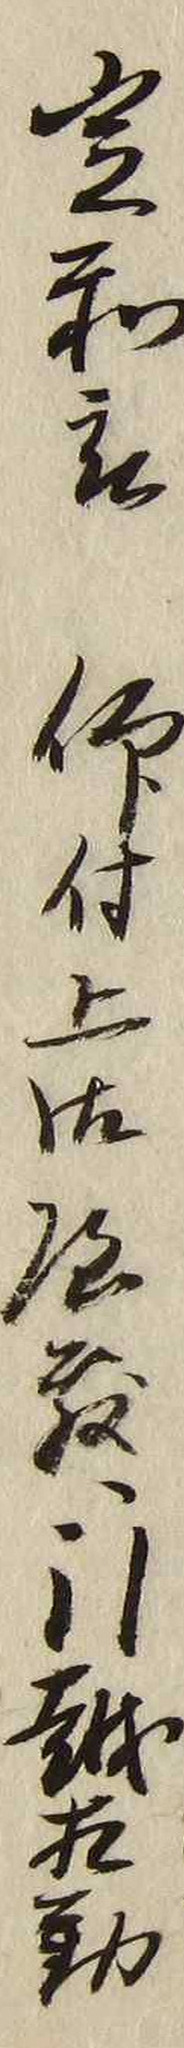定和被仰付上御屋敷へ引越相勤

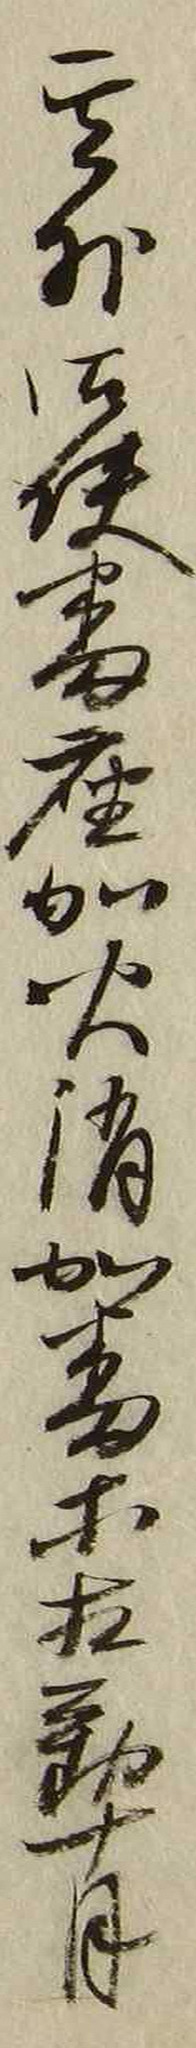其外御使番座加火消加番等相勤十月
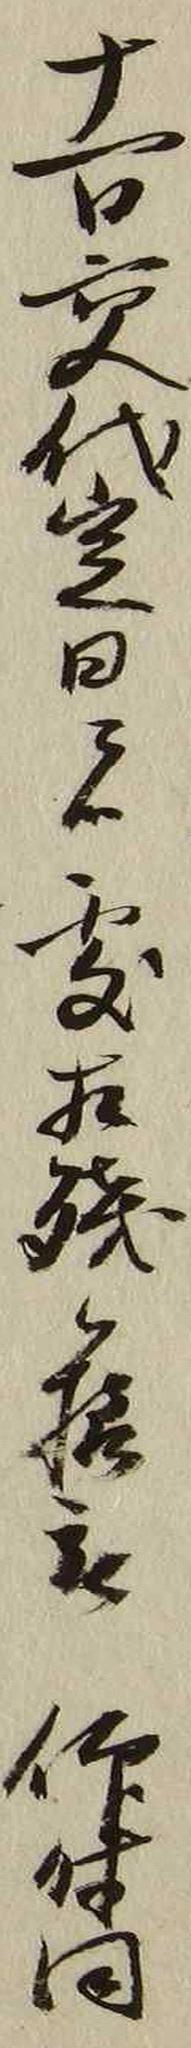十一日交代定日ニ候処相残候様被仰付同
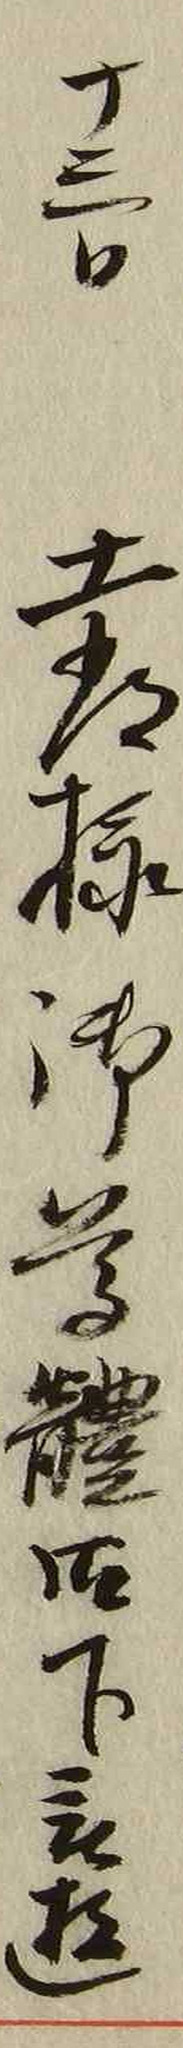十三日土常様御尊体御下被遊
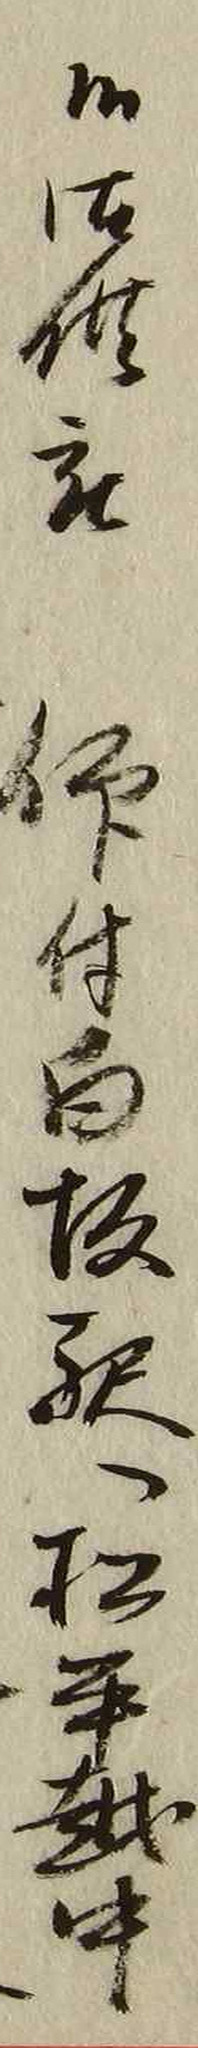候御供被仰付白坂駅へ松平越中
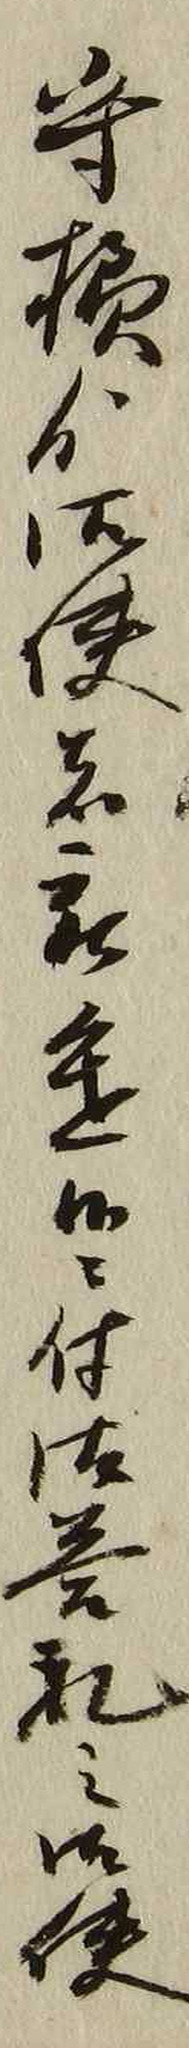守様ゟ御使者被遣候ニ付御答礼之御使
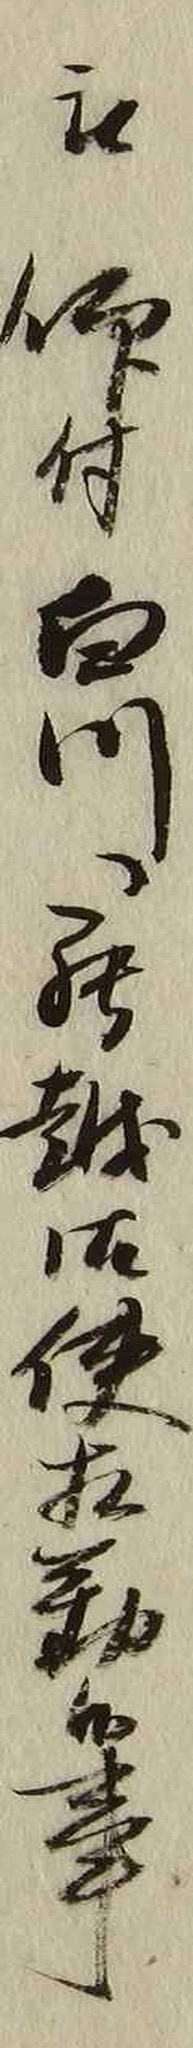被仰付白川へ罷越御使相勤候事
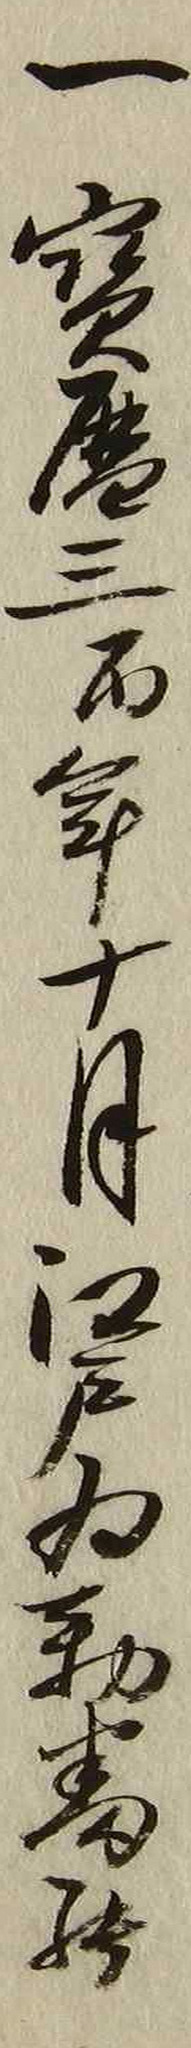一宝暦三酉年十月江戸為勤番罷
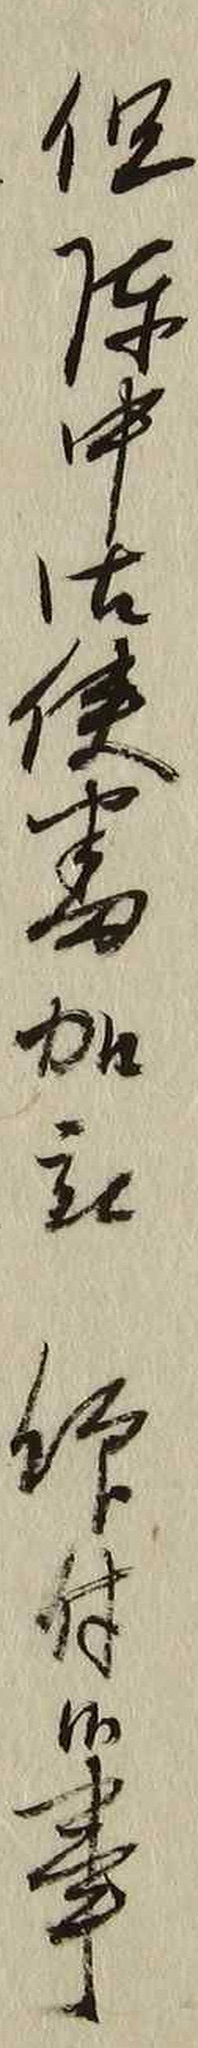但陣中御使番加被仰付候事
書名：諸士系譜　巻之356　す之部6
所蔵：会津若松市立会津図書館
